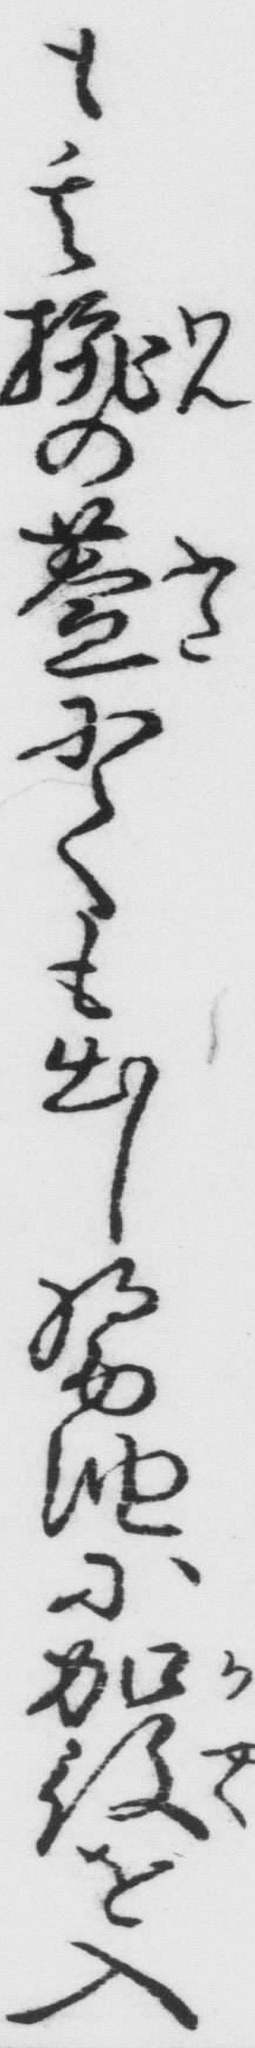も其椀の蓋にても出し醤油に加役を入
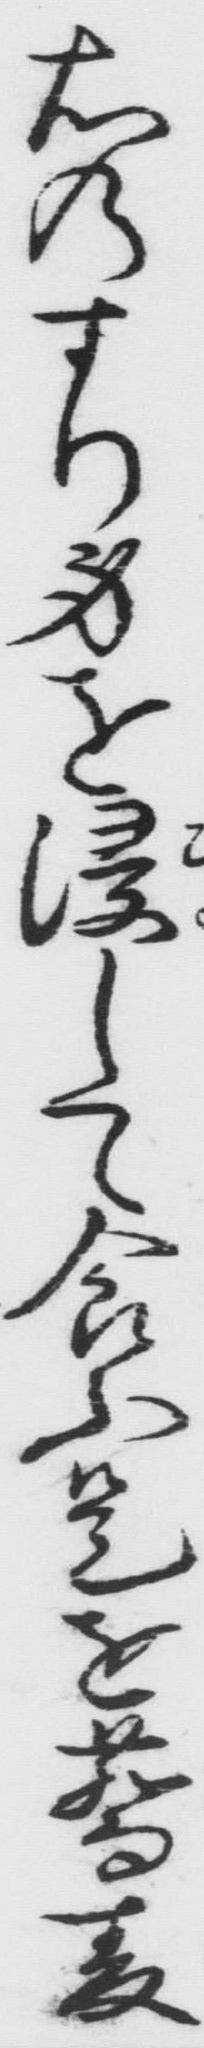右のすり身を浸して食ふ是を蕎麦
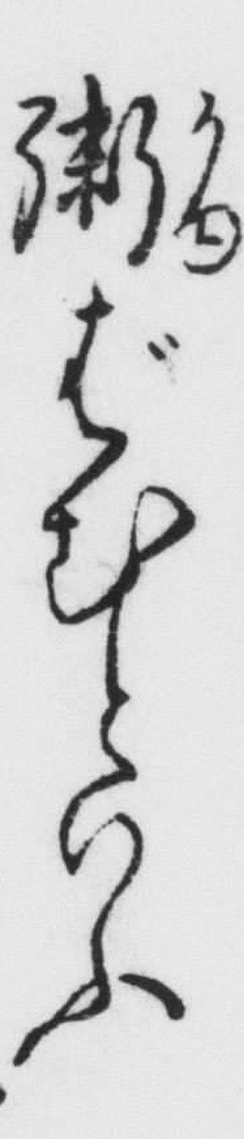粥ばむといふ
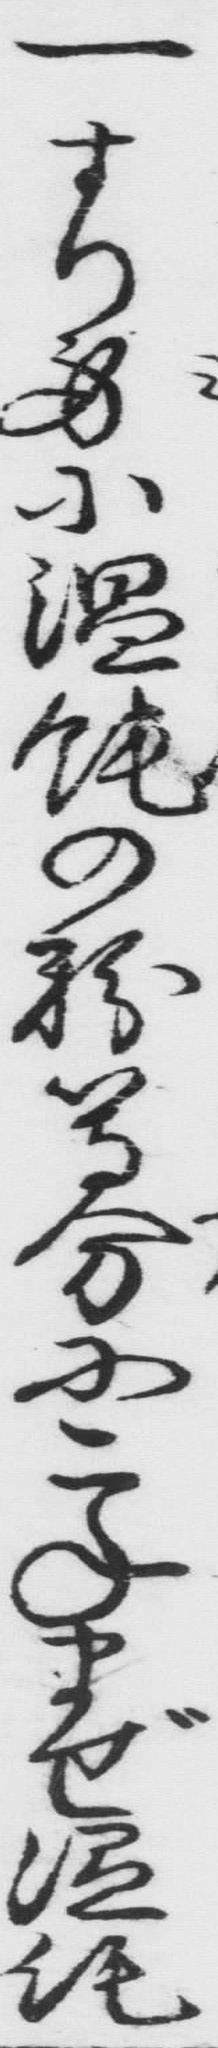一すり身に温飩の粉等分にこねまぜ温飩
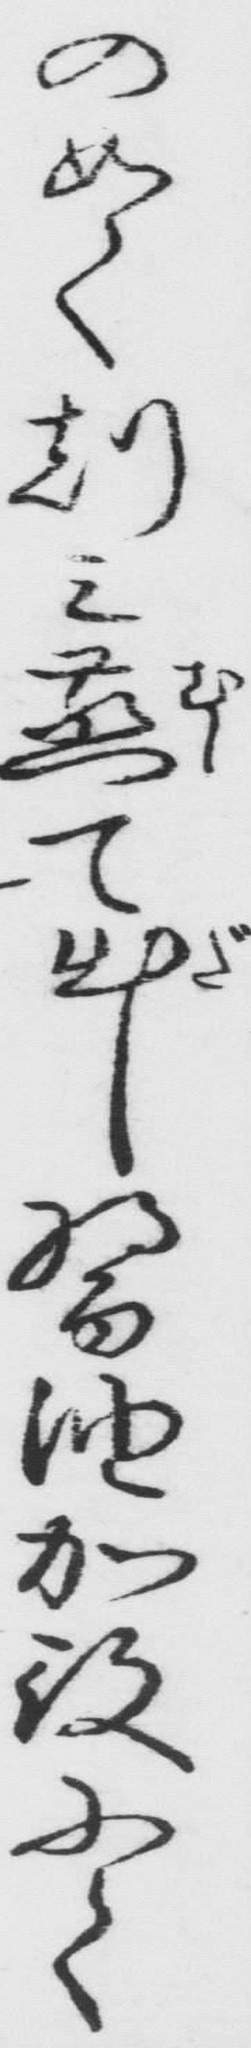の如く刻み蒸て出し醤油加役にて
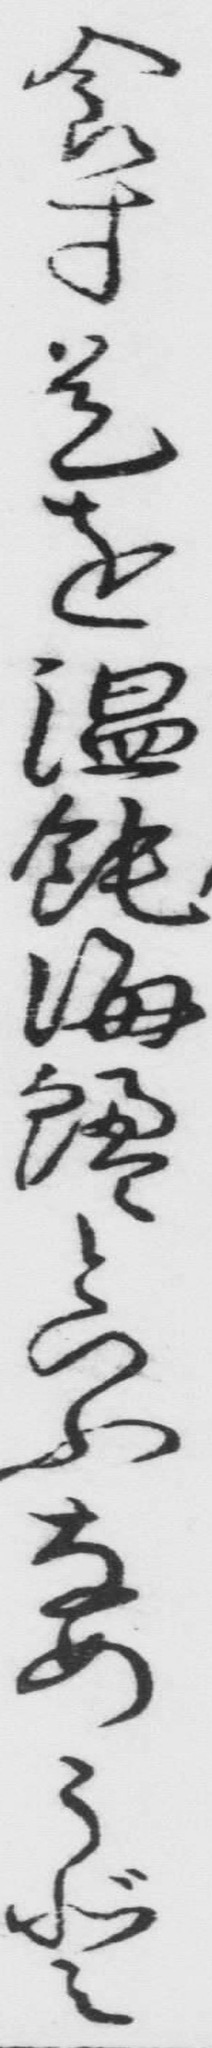食す是を温飩海鱧といふなめうど
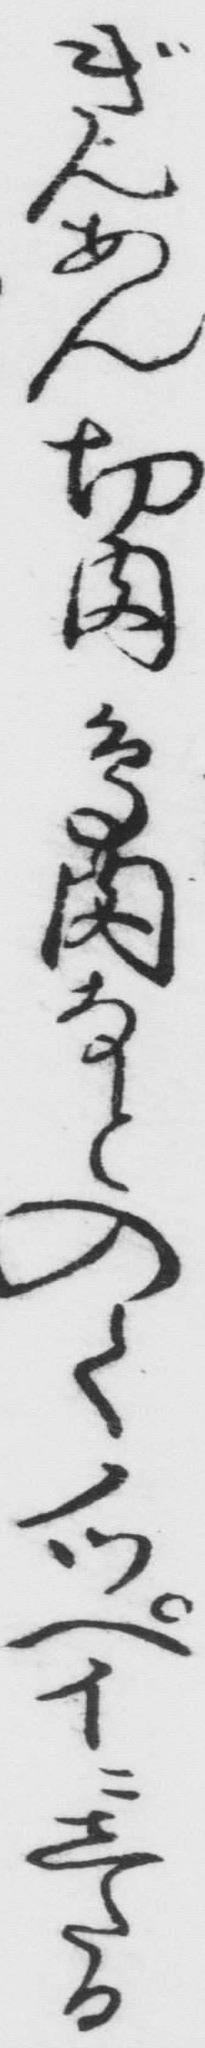ぎんあん切肉鳥肉なと入てノツペイにしたる
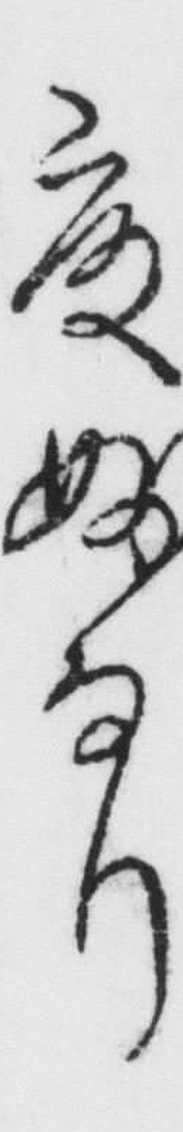最妙なり
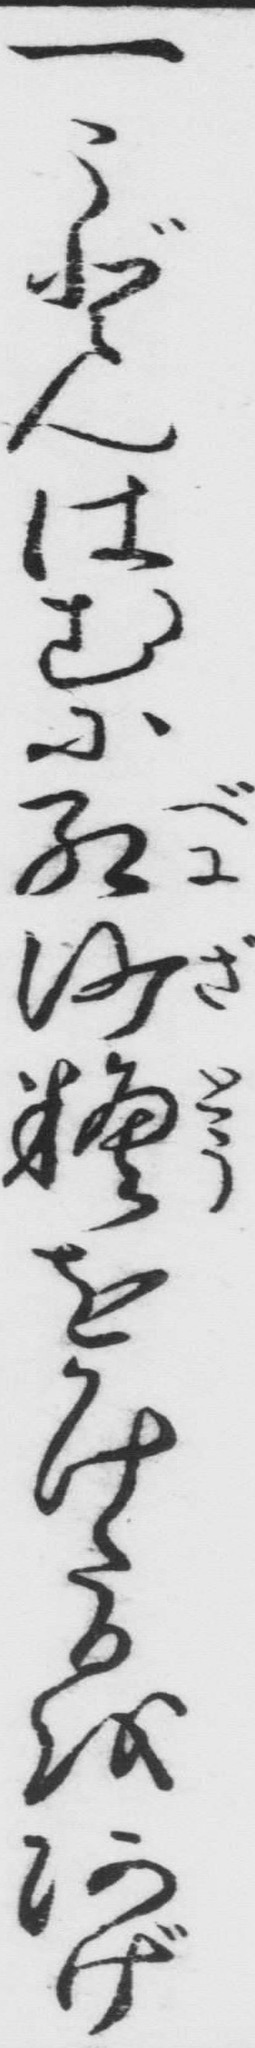一うどんはむに紅沙糖をかけたるをあげ
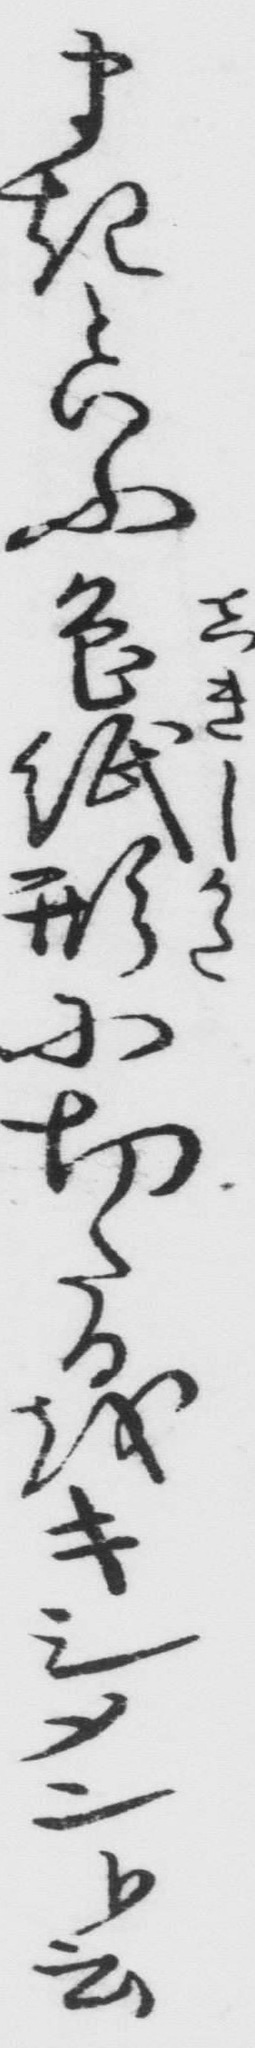まきといふ色紙形に切たるをキシメンと云
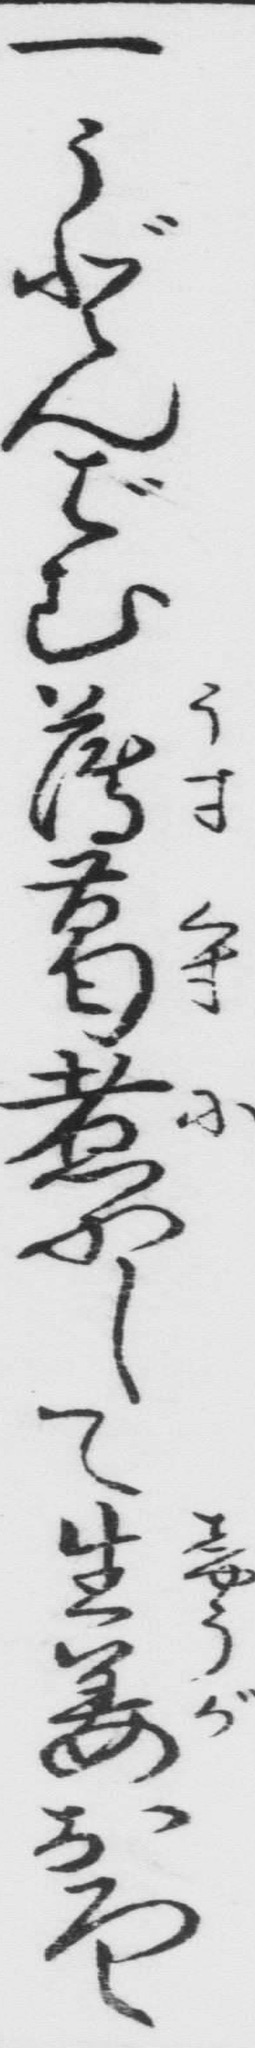一うどんばむ薄葛煮にして生姜おろし

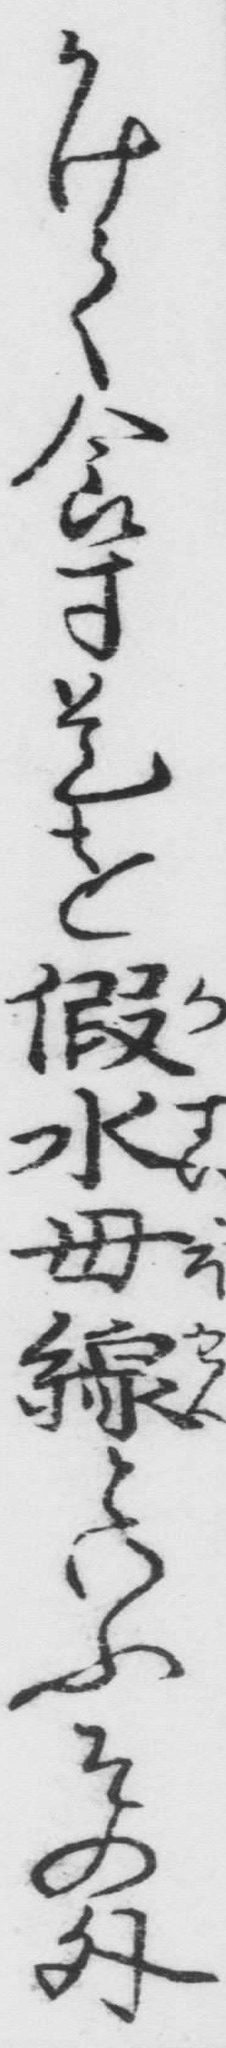かけて食す是を假水母線といふその外
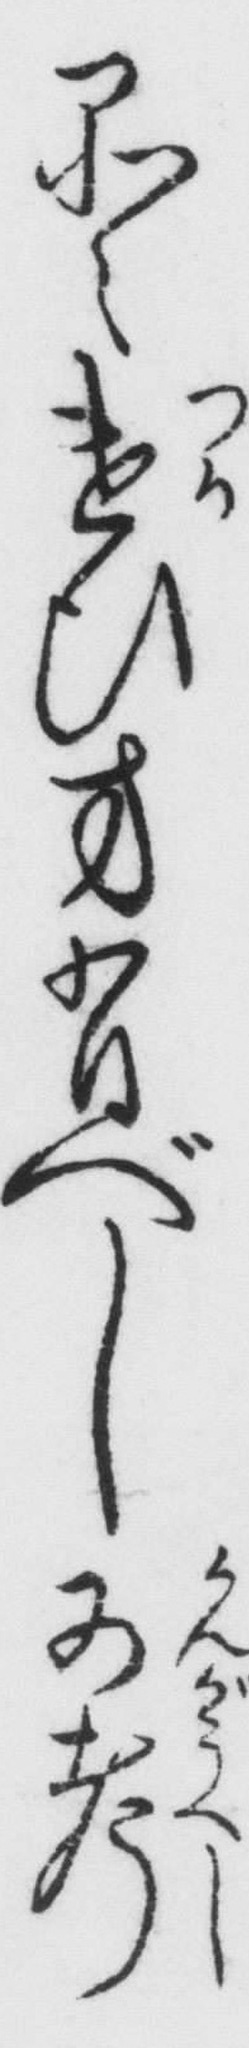品々遣ひ方有べし可考
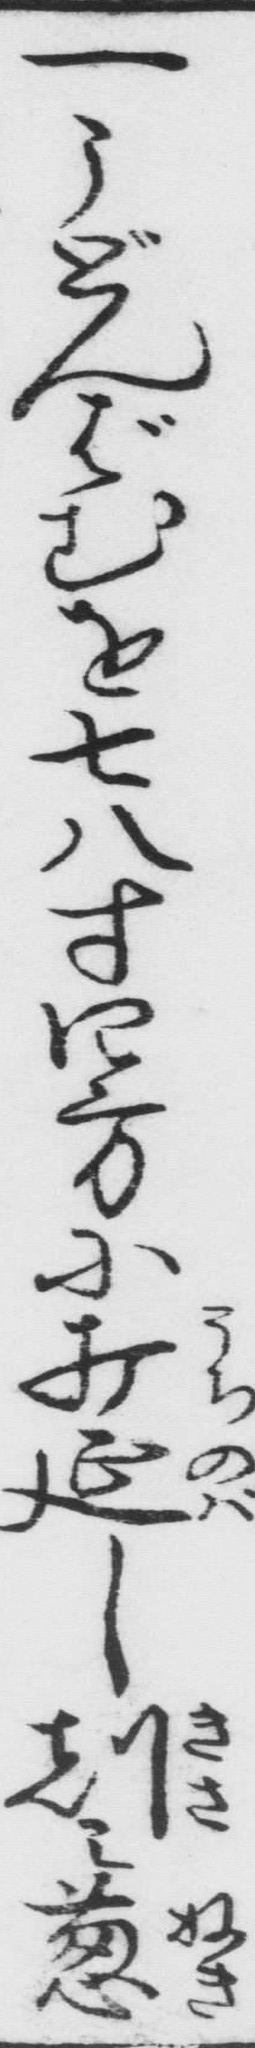一うどんばむを七八寸四方に打延し刻み葱
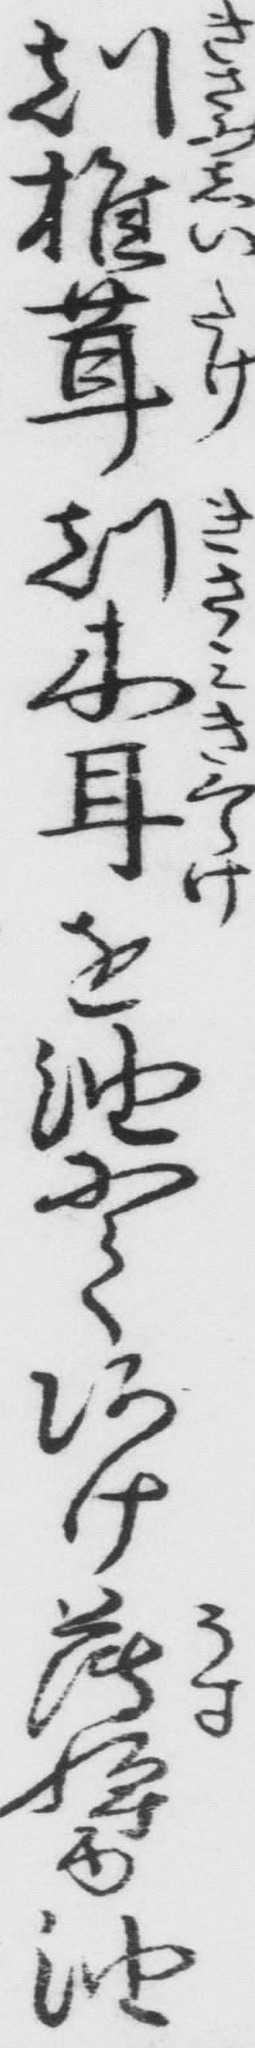刻椎茸刻木耳を油にてあけ薄醤油
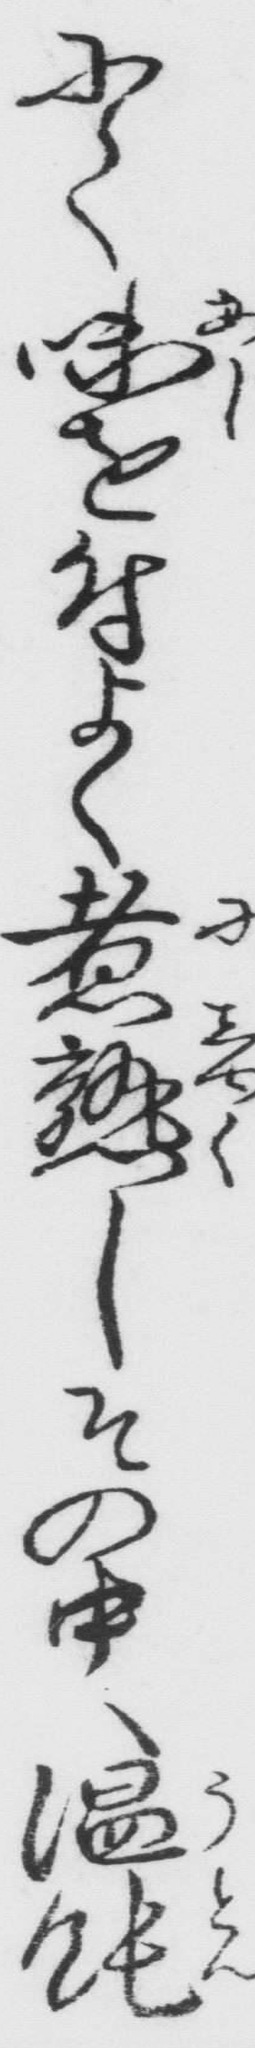にて味を付よく煮熟しその中へ温飩
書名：海鰻百珍
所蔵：大阪府立大学学術情報センター 国文学研究資料館
